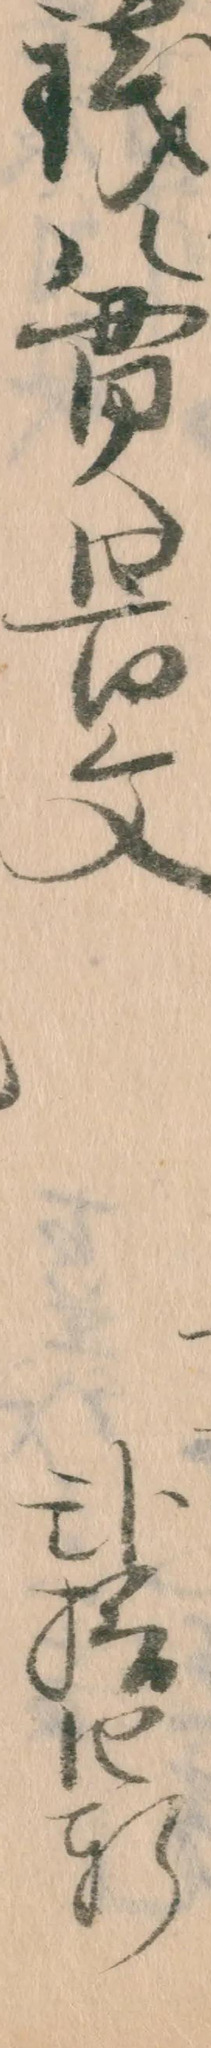一銭八貫四百文弐拾四軒
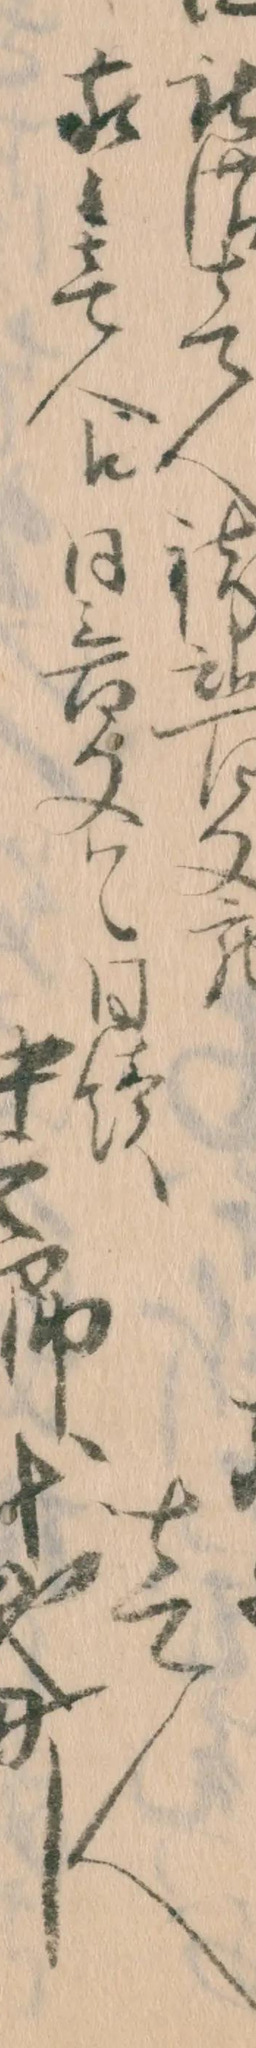家主壱人え同三百文ツヽ壱人
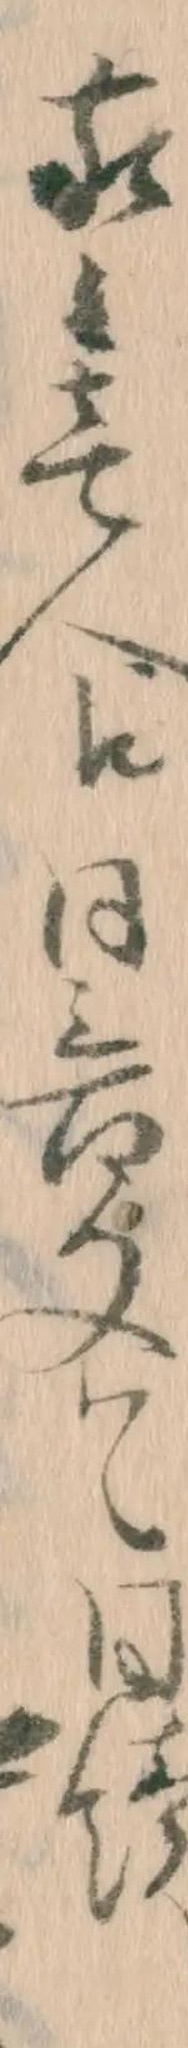家主壱人え同三百文ツヽ壱人
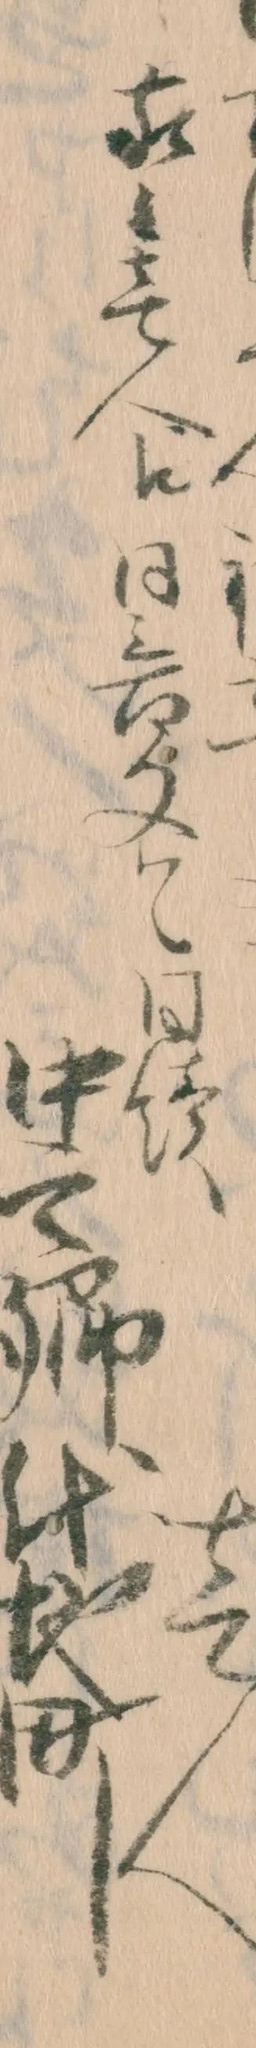家主壱人え同三百文ツヽ壱人
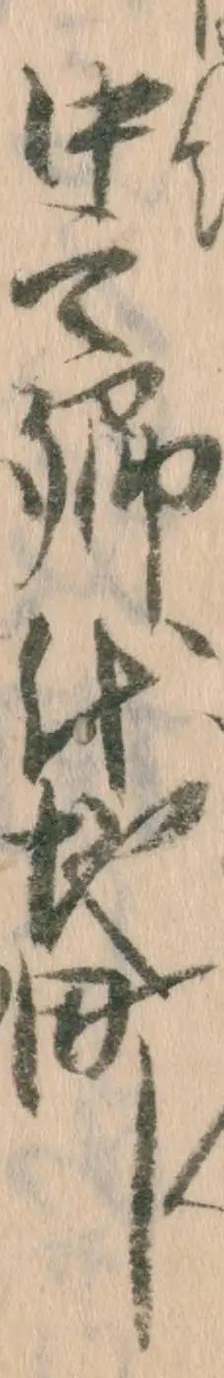中之郷代地町
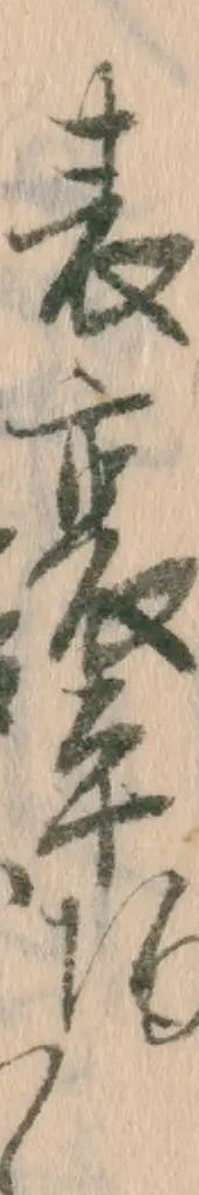表裏平均
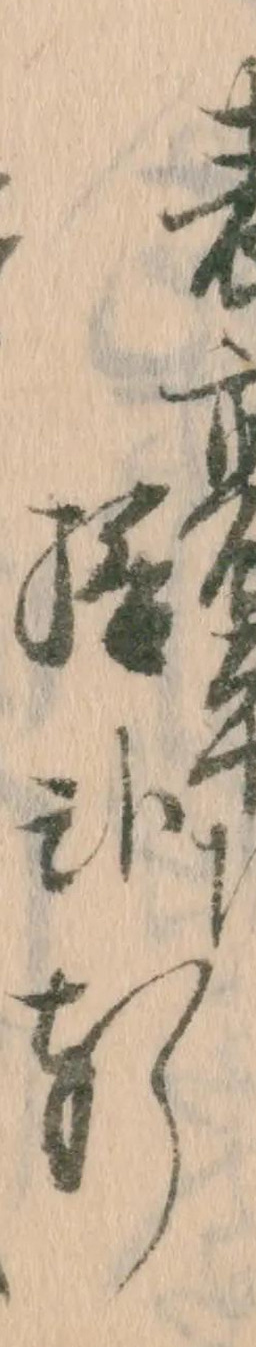拾弐軒
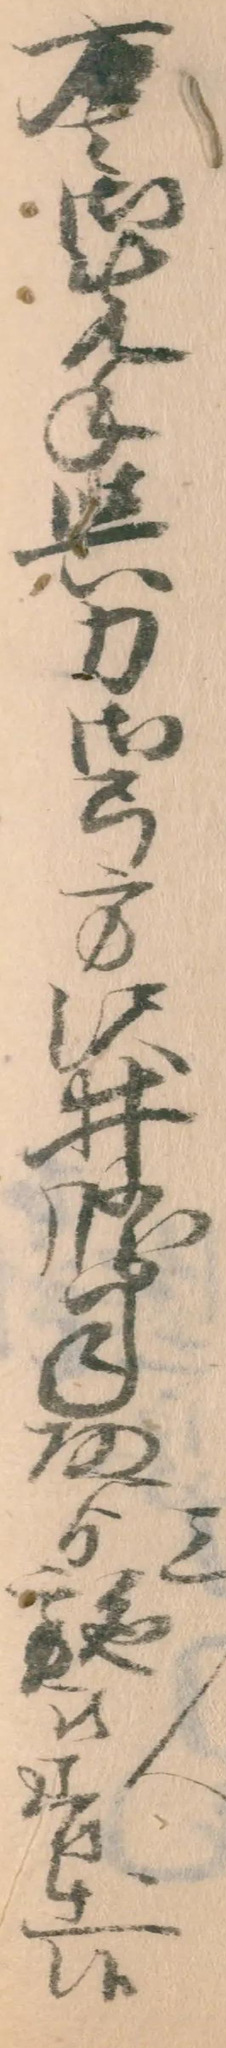右は御先手与力御弓方沢井勝司殿ゟ施被差出候
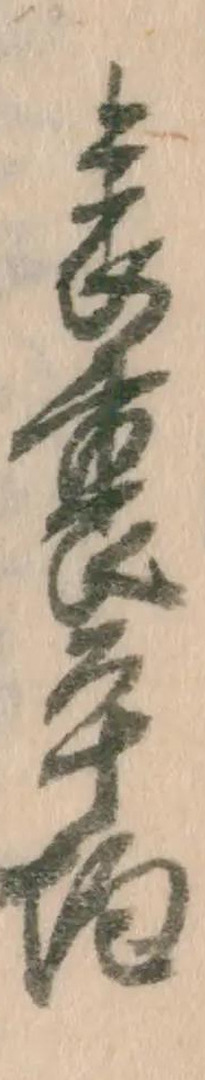表裏平均
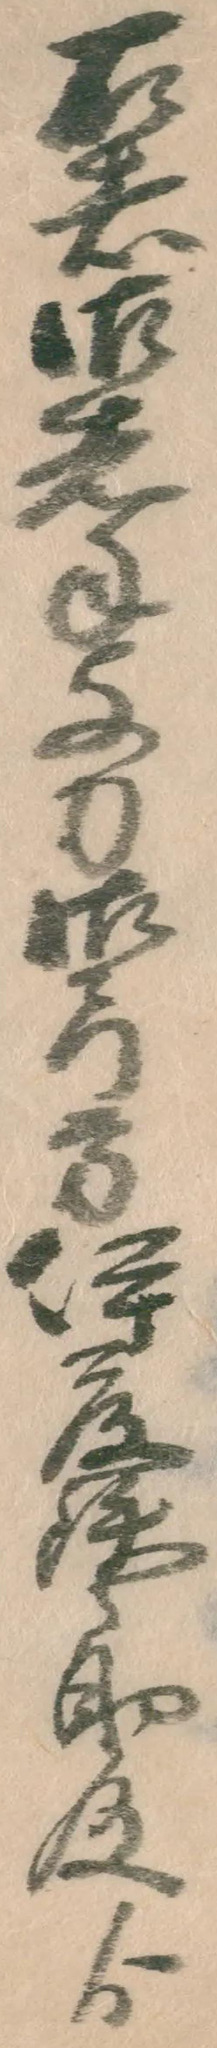右は御先手与力御弓方伊藤鉄之助殿ゟ
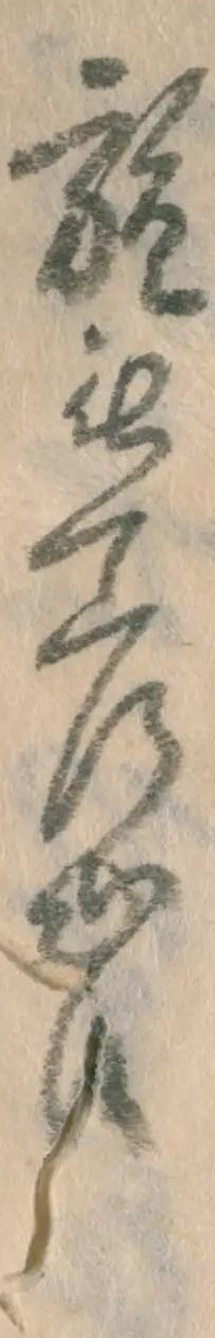施被差出候

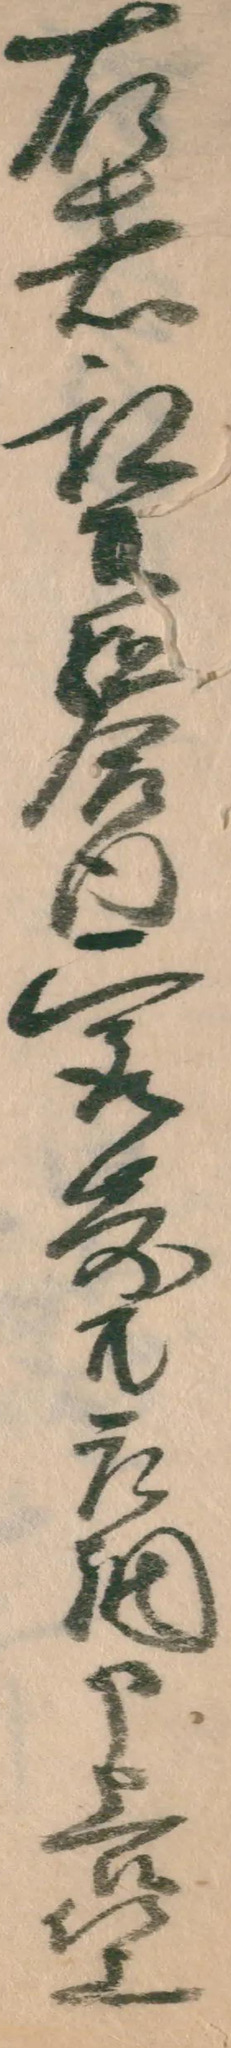右は私共組合内最寄共取調申上候以上
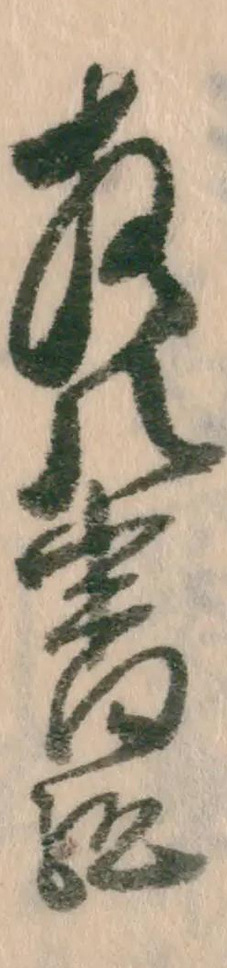拾八番組
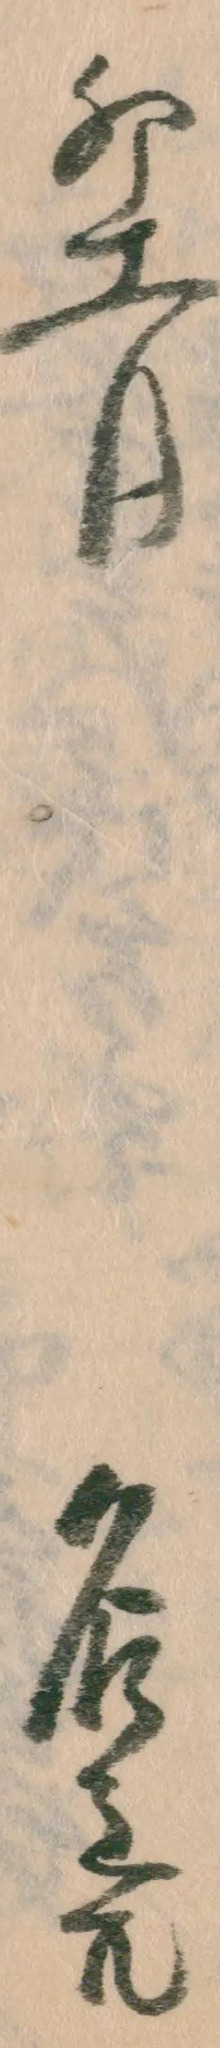卯十一月名主共
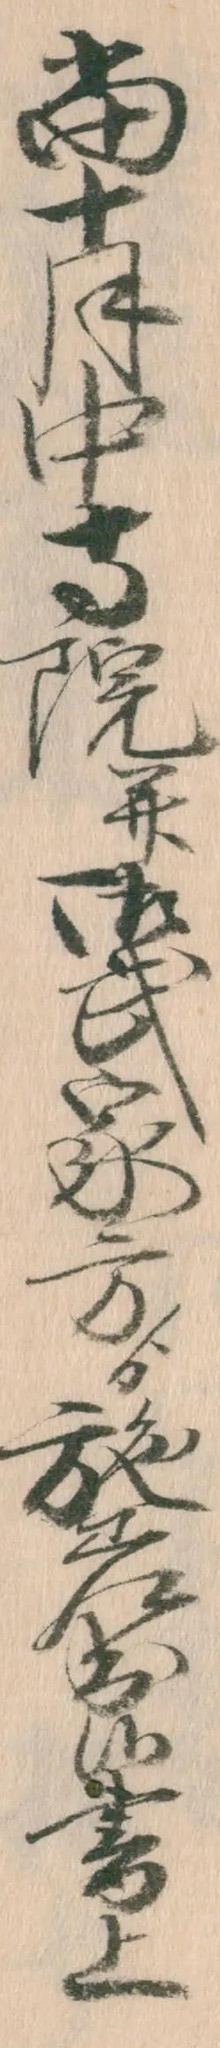当十月中寺院并御武家方ゟ施差出候書上
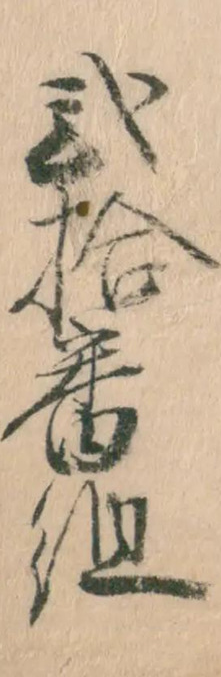弐拾番組
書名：武家方并寺院等ニテ施差出候一件
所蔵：国立国会図書館 National Diet Library, JAPAN
